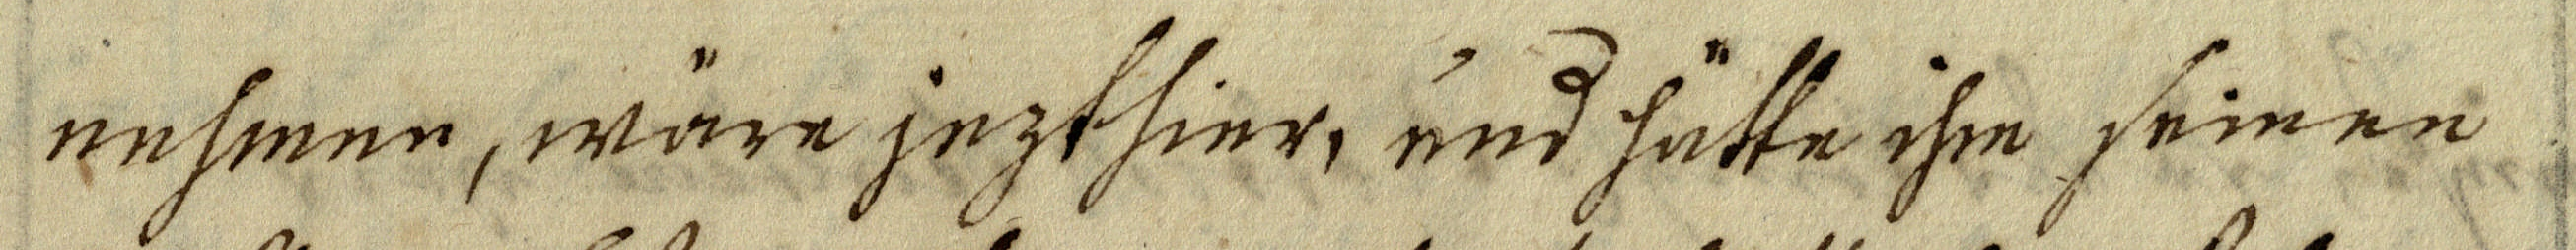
nehmen, wäre jezt hier, und hätte ihm seinen
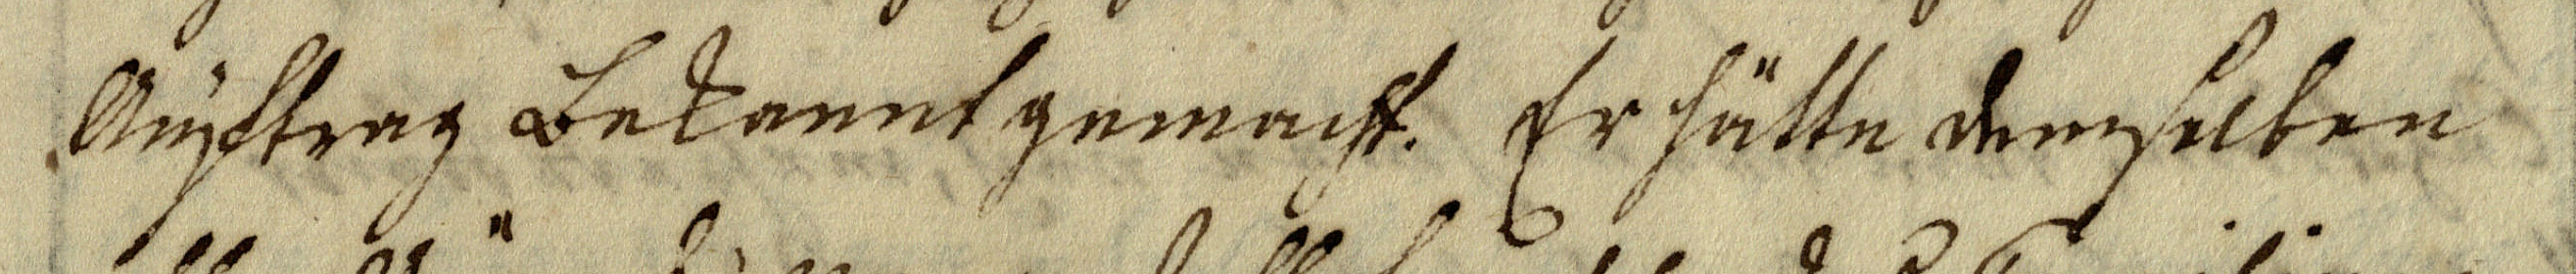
Auftrag bekannt gemacht. Er hätte demselben
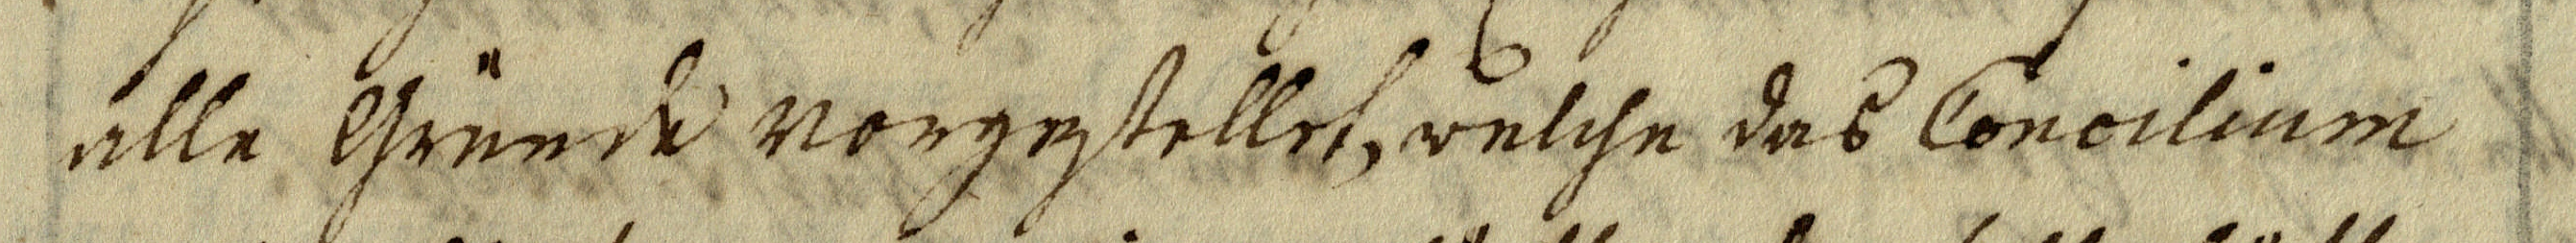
alle Gründe vorgestellet, welche das Concilium
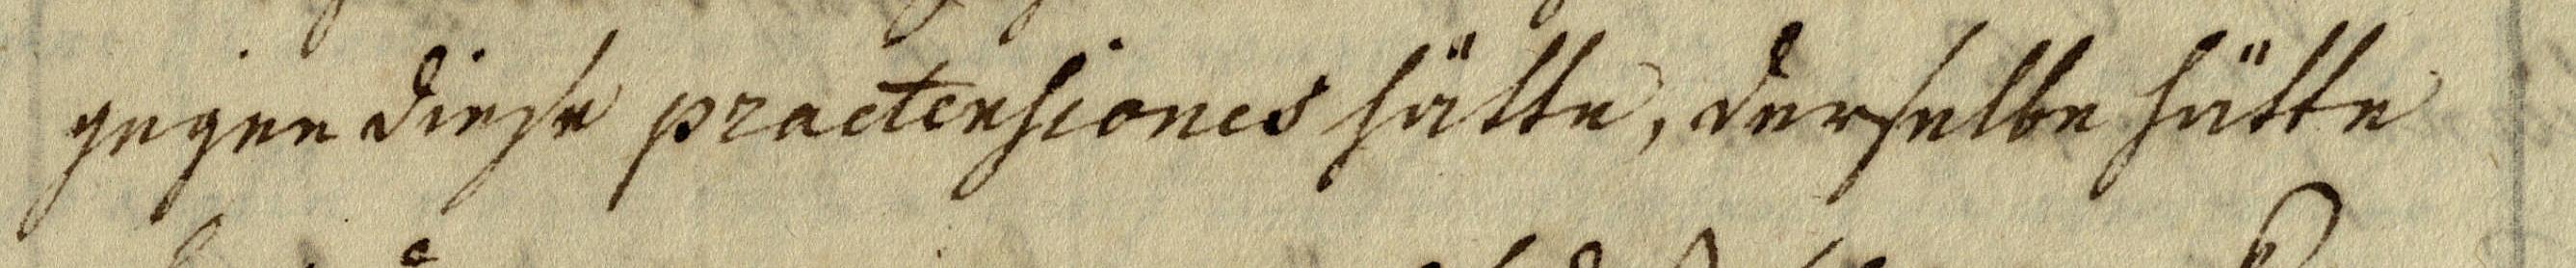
gegen diese praetensiones hätte, derselbe hätte
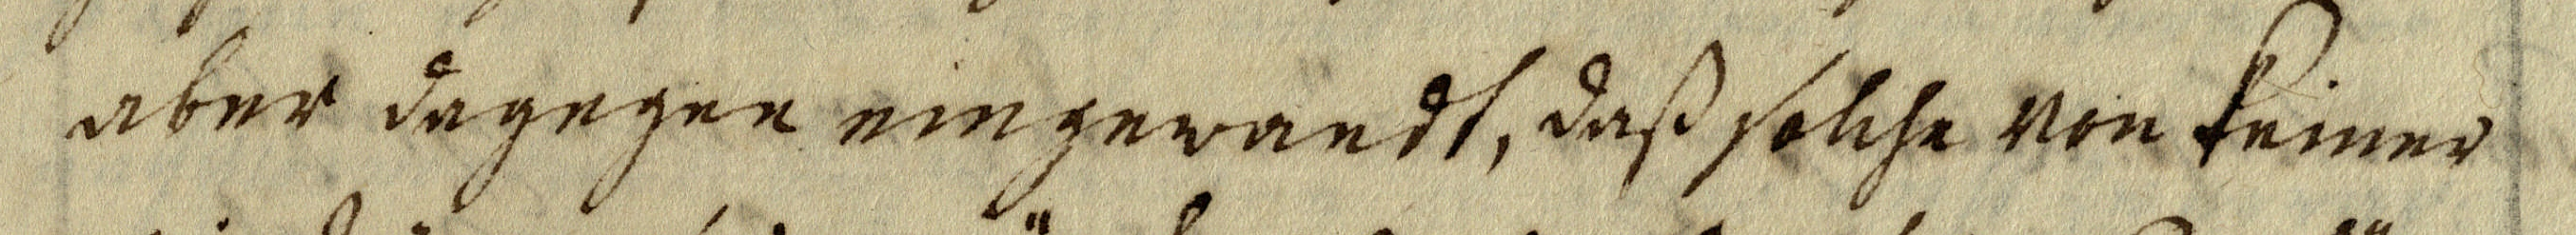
aber dagegen eingewandt, daß solche von keiner
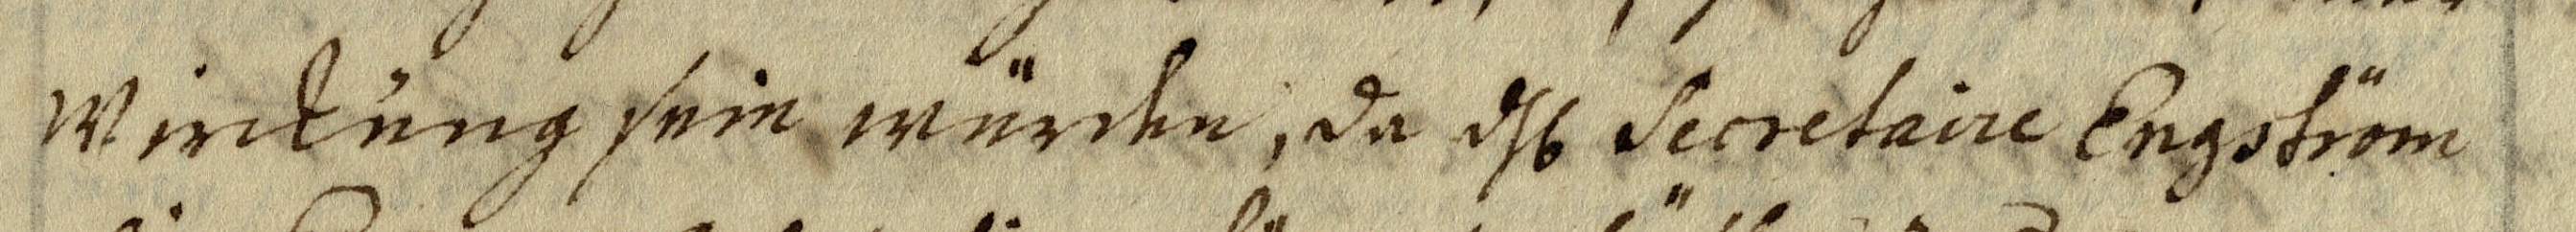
Wirckung sein würden, da dh Secretaire Engström
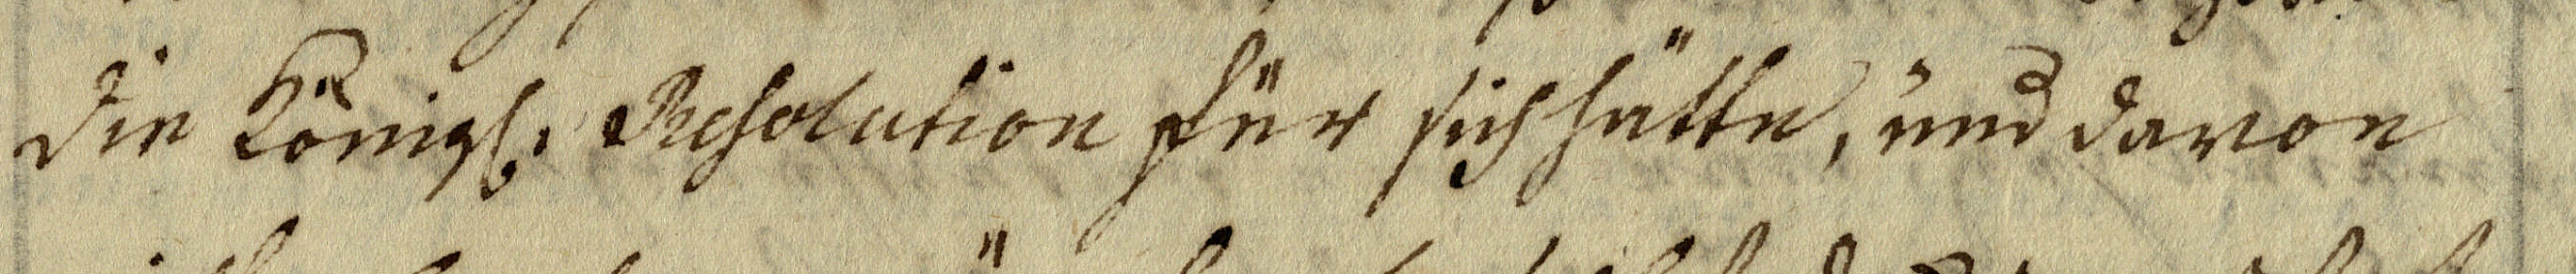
die Königl. Resolution für sich hätte, und davon
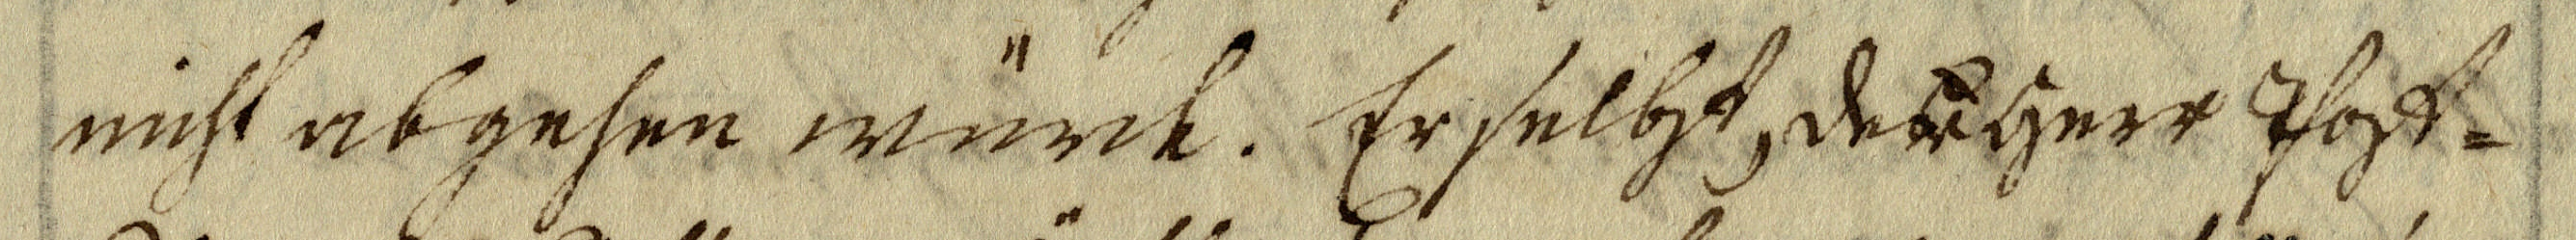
nicht abgehen würde. Er selbst, der Herr Post¬
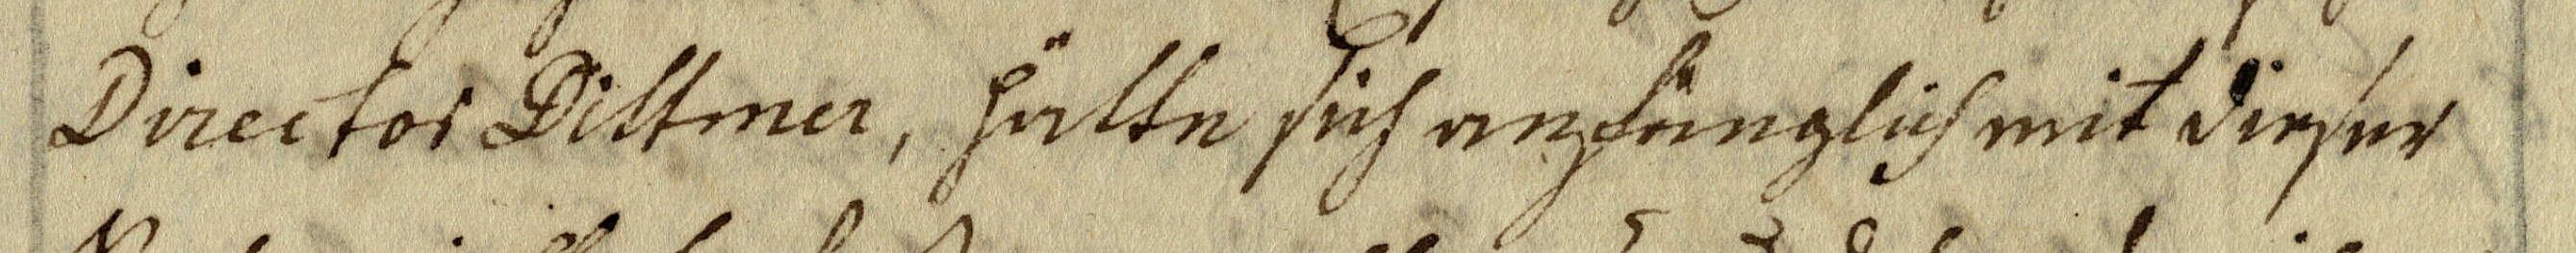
Director Dittmer, hätte sich anfänglich mit dieser
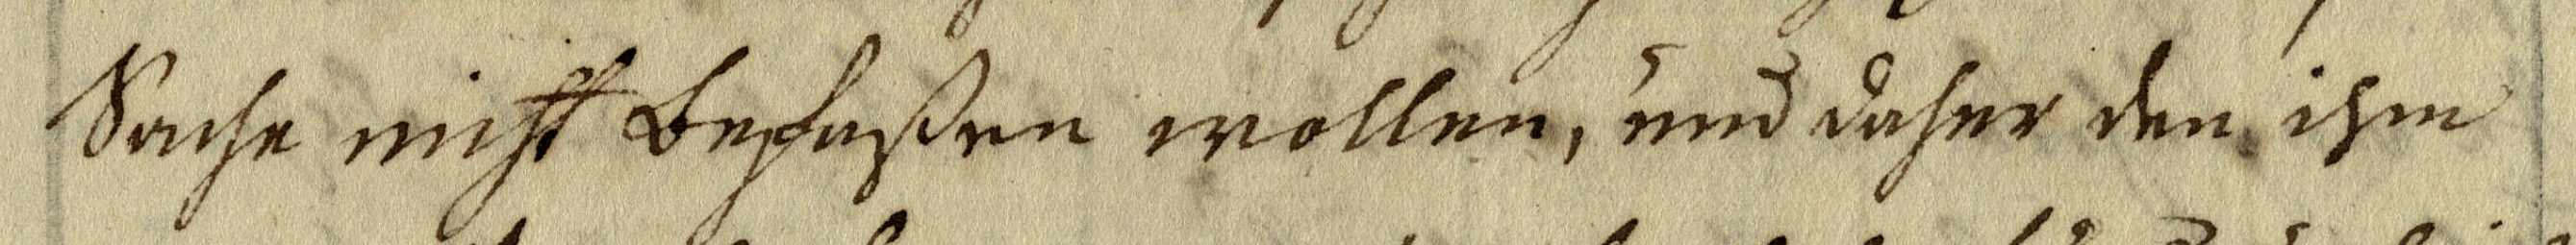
Sache nicht befaßen wollen, und daher den ihm
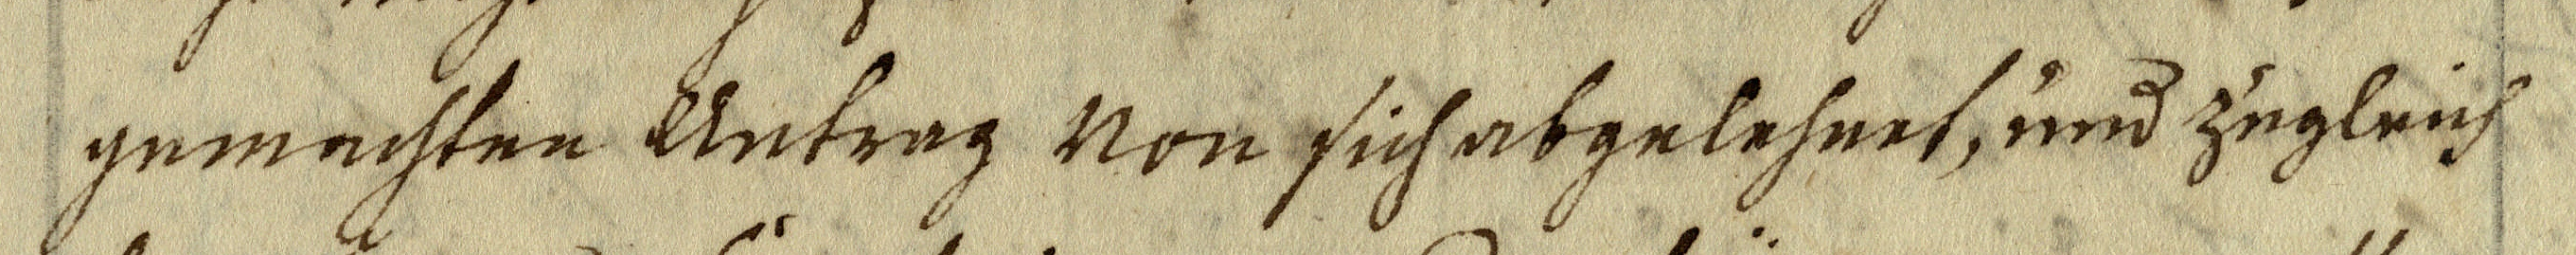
gemachten Antrag von sich abgelehnet, und zugleich
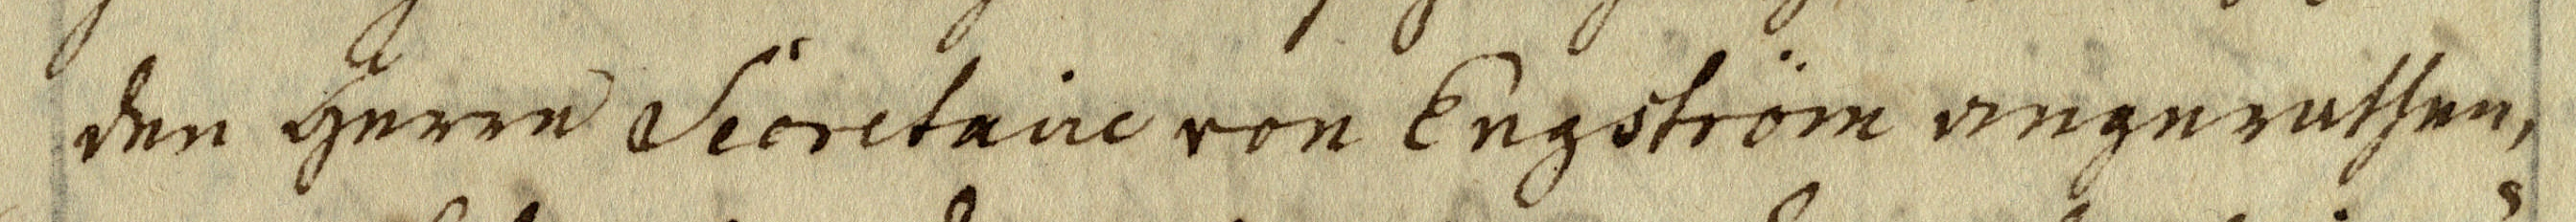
den Herrn Secretaire von Engström angerathen,
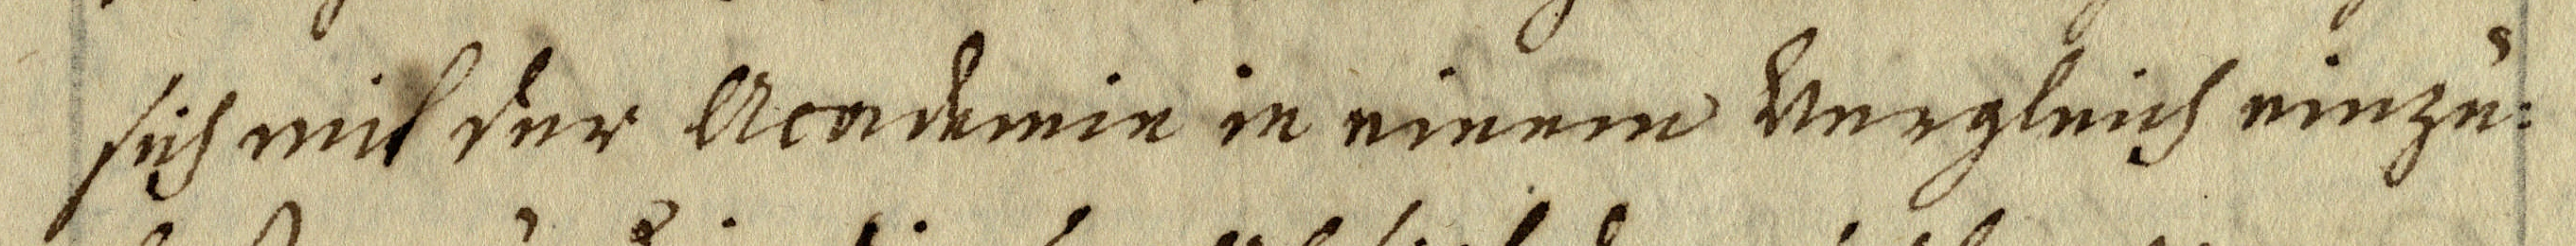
sich mit der Academie in einem Vergleich einzu¬
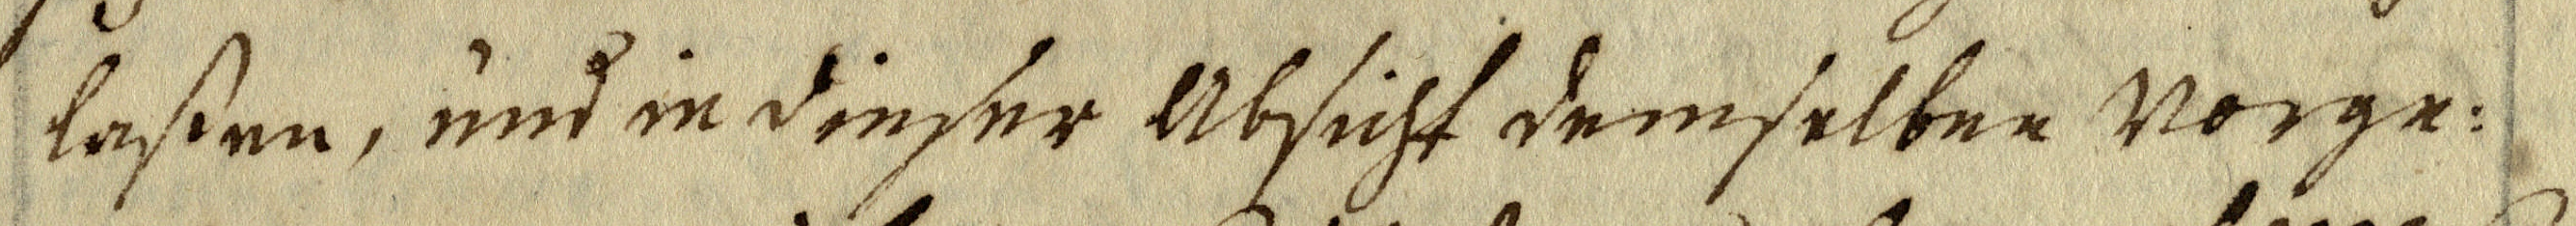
laßen, und in dieser Absicht demselben vorge¬
